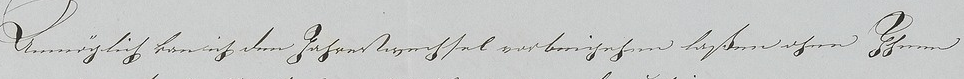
Unmöglich kan ich den Jahreswechsel vorbeigehen laßen ohne Ihnen
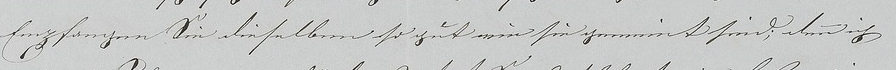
Empfangen Sie dieselben so gut wie sie gemeint sind; denn ich
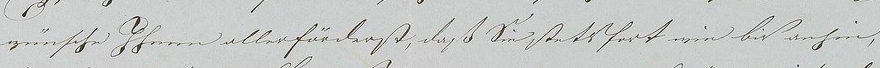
wünsche Ihnen allerförderst, daß Sie stetsfort wie bis anhin,
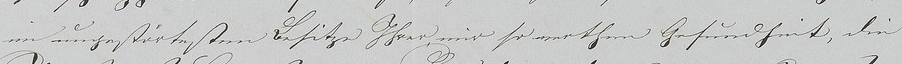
im ungestörtesten Besitze Ihrer, mir so werthen Gesundheit, die
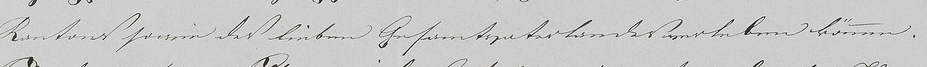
Kantons sowie des lieben Gesamtvaterlandes verleben können.
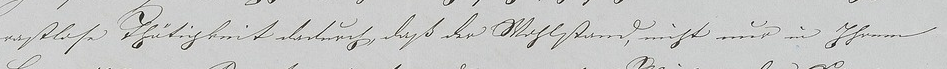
rastlose Thätigkeit dadurch, daß der Wohlstand, nicht nur in Ihrem
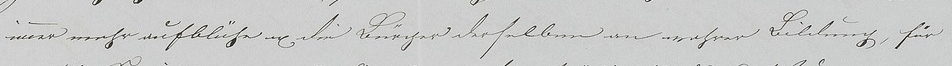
immer mehr aufblühe & die Bürger derselben an wahrer Bildung, für
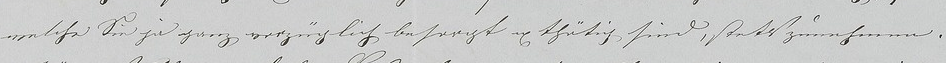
welche Sie ja ganz vorzüglich besorgt & thätig sind, stets zunehmen.
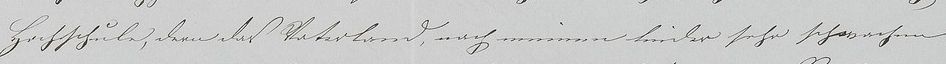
Hochschule, dern das Vaterland, nach meinen leider sehr schwachen
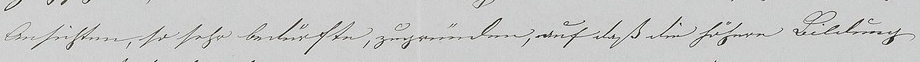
Ansichten, so sehr bedürfte, zugründen, auf daß die höhere Bildung
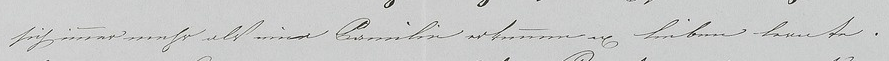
sich immer mehr als eine Familie erkennen & lieben lernte.
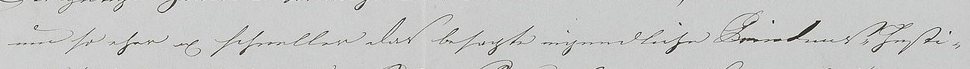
um so eher & schneller das besagte eigendliche Friedens-Insti-
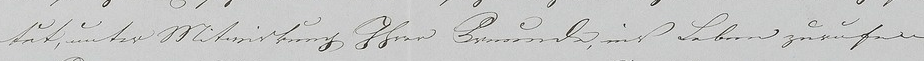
tut, unter Mitwirkung Ihrer Freunde, ins Leben zurufen
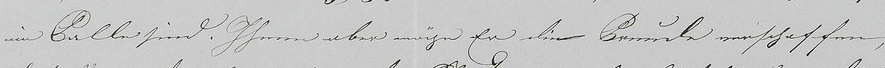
im Falle sind. Ihnen aber möge Er die Freude verschaffen,
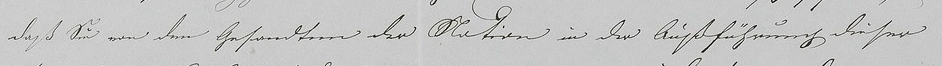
daß Sie von den Gesandten der Nation in der Außführung dieser
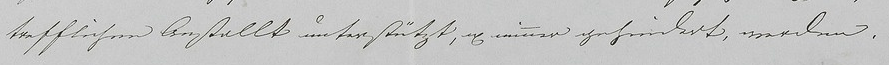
trefflichen Anstallt unterstützt, & nimmer gehindert, werden.
